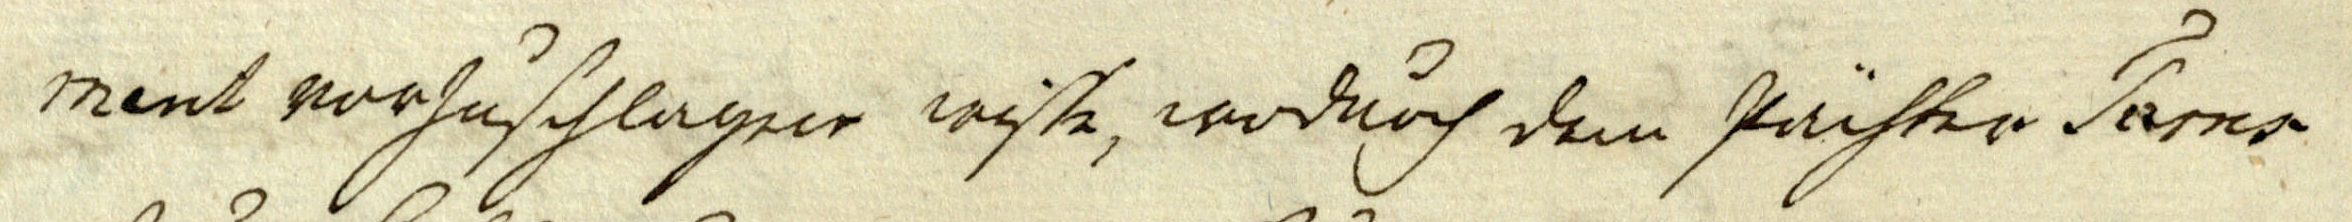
ment vorzuschlagen wisse, wodurch dem Pächter Tams
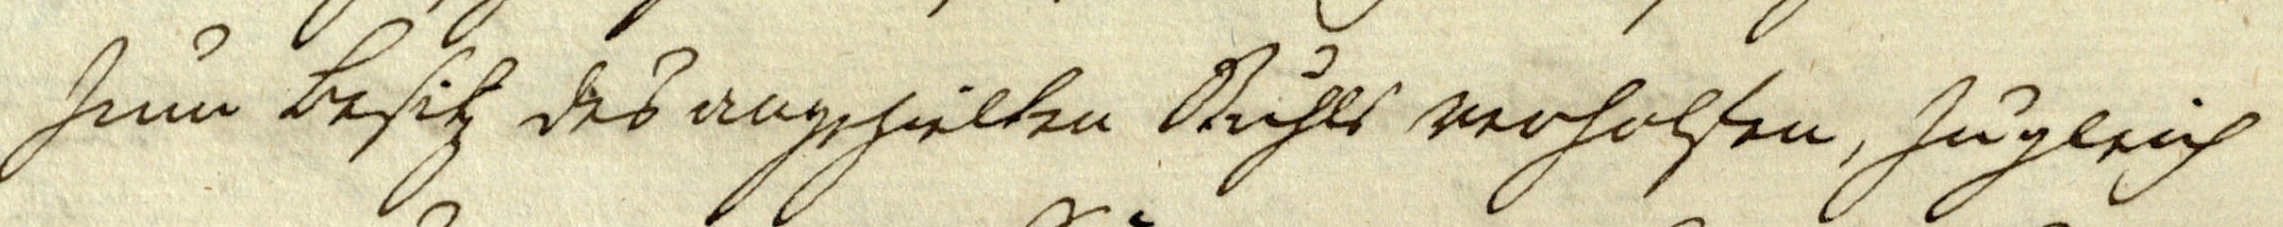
zum Besitz des angezielten Stuhls verholfen, zugleich
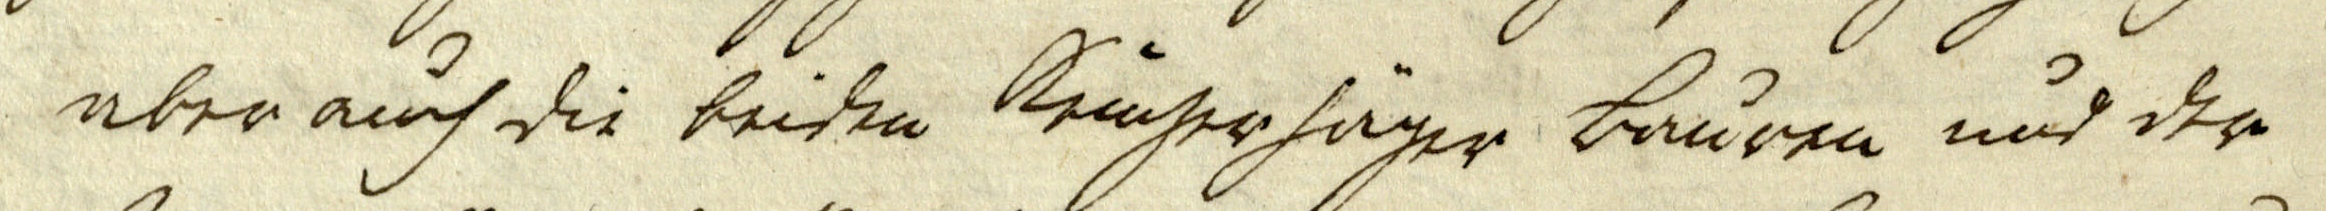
aber auch die beiden Kemzerhäger Bauren und der
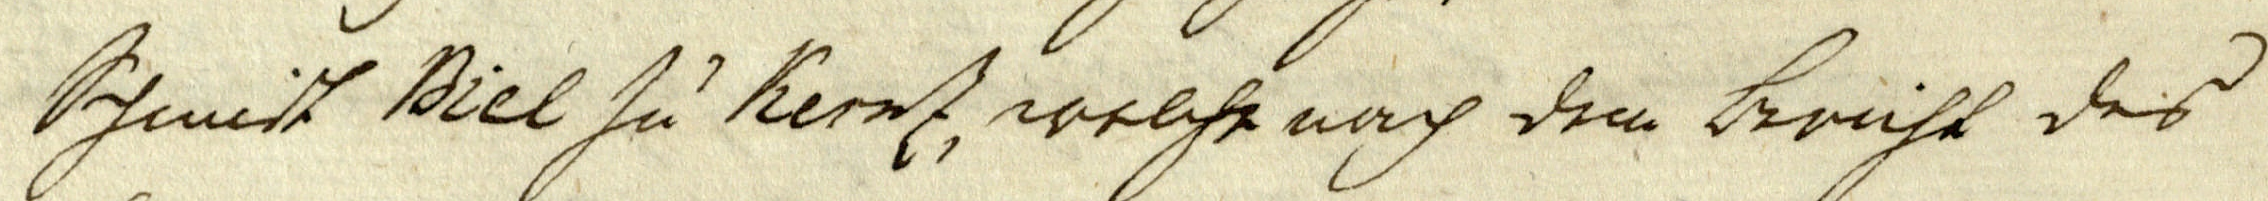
Schmidt Biel zu Kemz, welche nach dem Bericht des
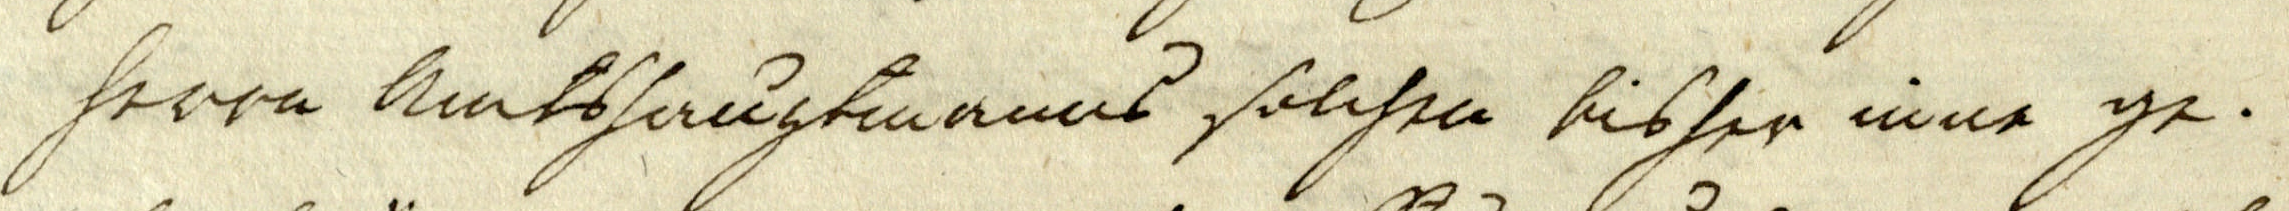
herrn Amtshauptmanns solchen bisher inne ge¬
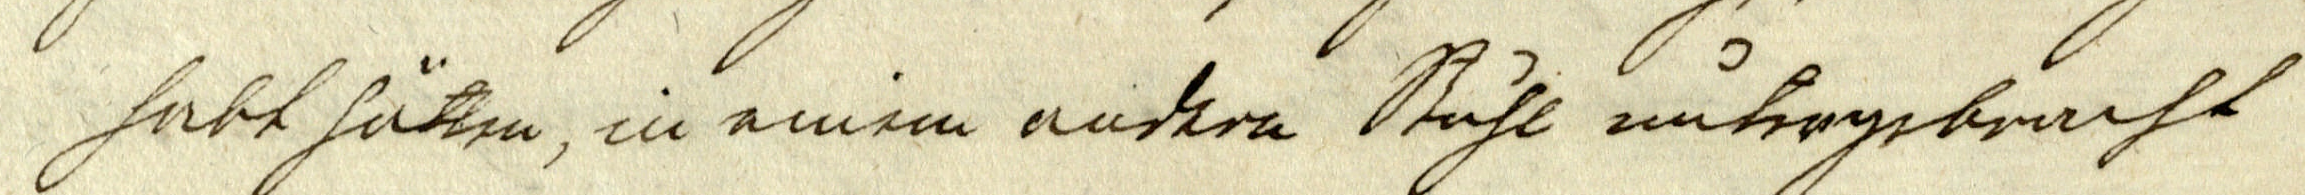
habt hätten, in einem anderen Stuhl untergebracht
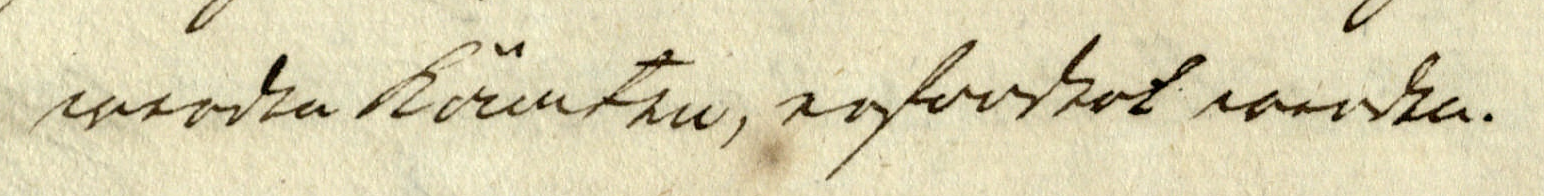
werden könnten, erfordert werden.
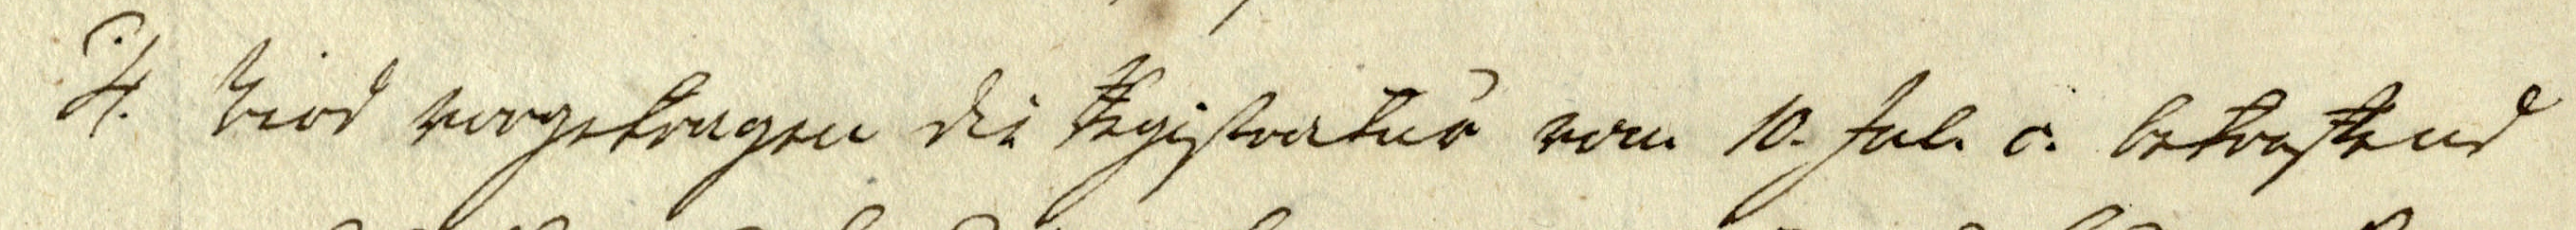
4. Wird vorgetragen die Registratur vom 10. Jul. c. betreffend
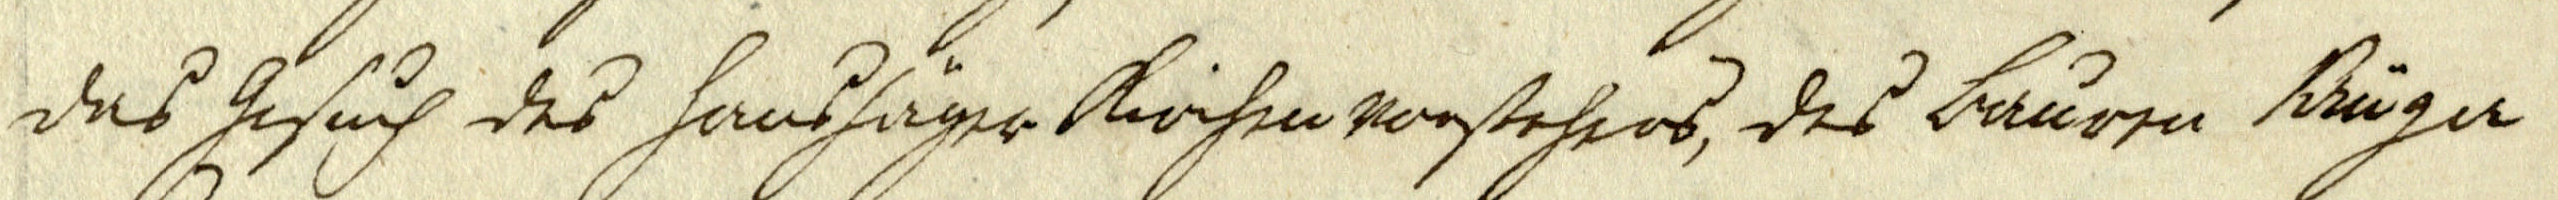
das Gesuch des Hanshäger Kirchenvorstehers, des Bauren Krüger
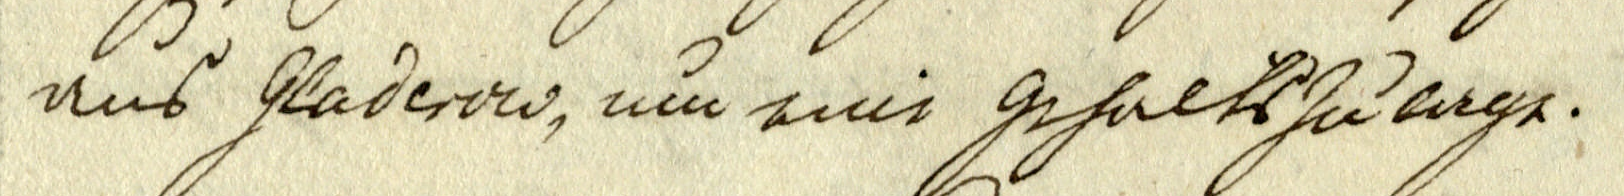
aus Gladerow, um eine Gehaltszulage.
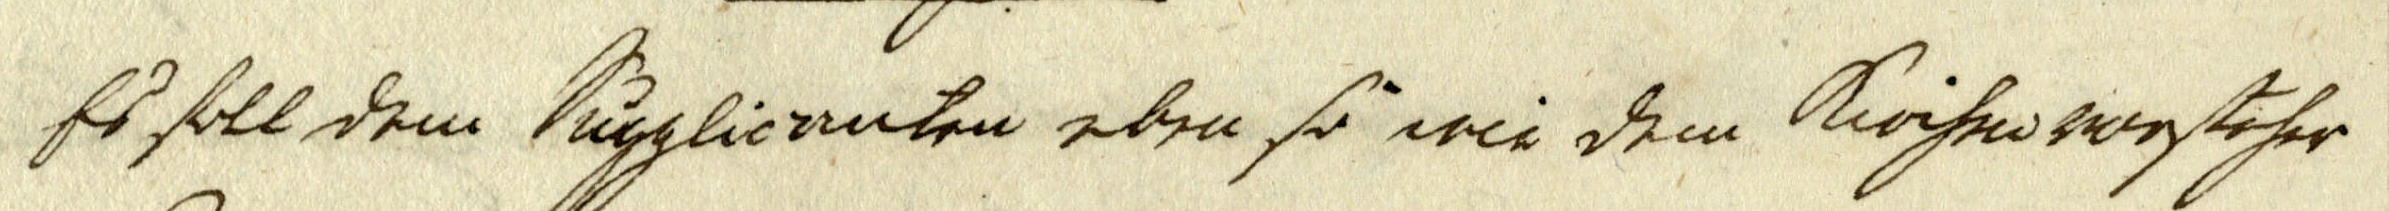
Es soll dem Supplicanten ebenso wie dem Kirchenvorsteher
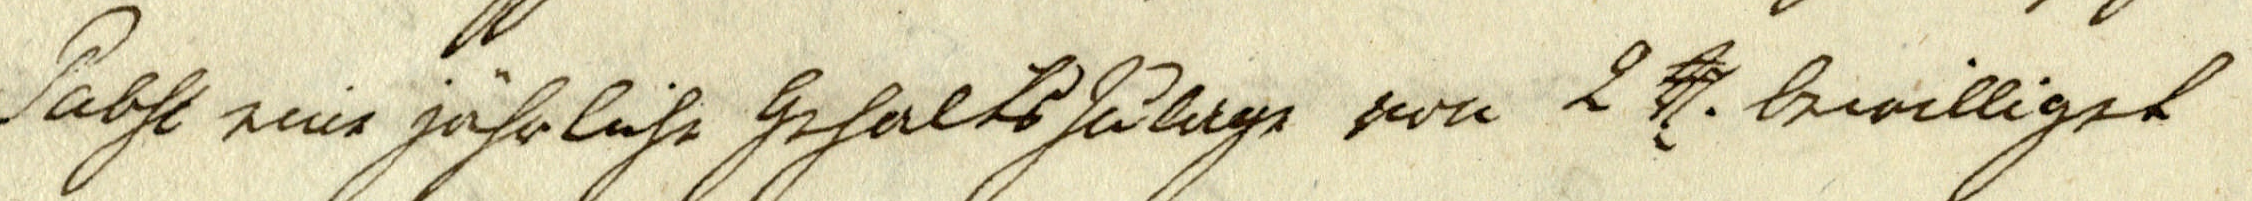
Pabst eine jährliche Gehaltszulage von 2 Rt. bewilliget
